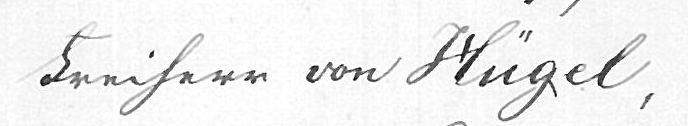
Freiherr von Hügel,
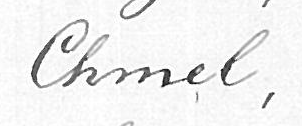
Chmel,
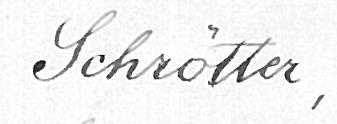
Schrötter,
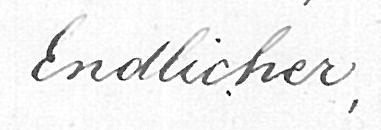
Endlicher,
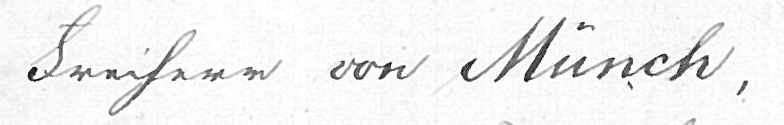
Freiherr von Münch,
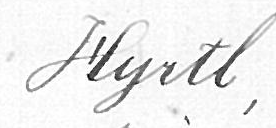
Hyrtl,
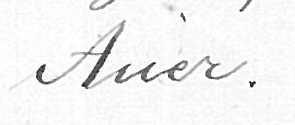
Auer.
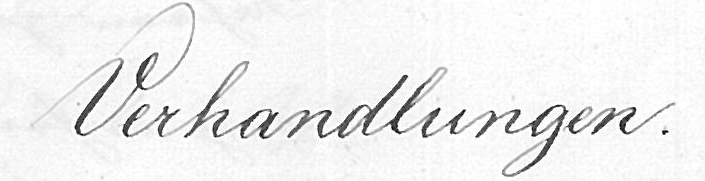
Verhandlungen.
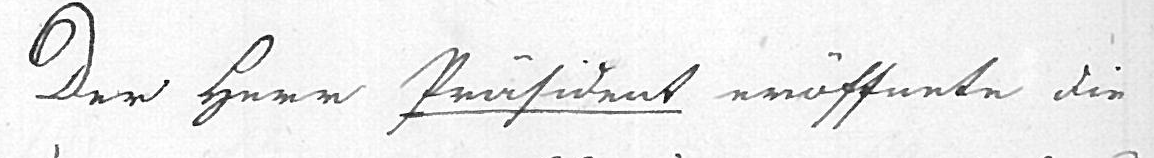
Der Herr Präsident veröffnet die
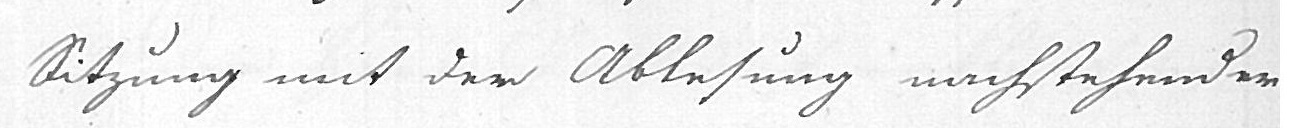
Sitzung mit der Ablesung nachstehender
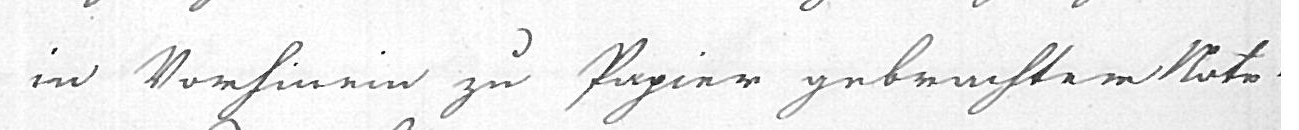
in Vorhein zu Papier gebrachter Note:
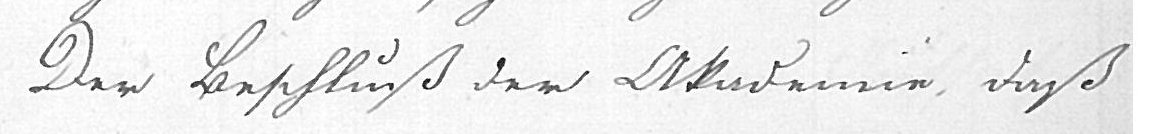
Der Beschluß der Akademie, daß
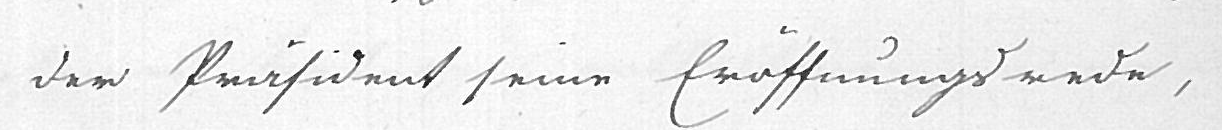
der Präsident seine Eröffnungsrede,
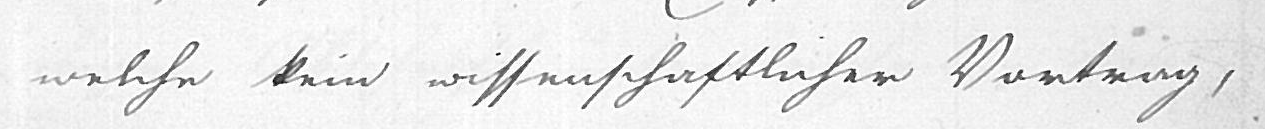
welche kein wissenschaftlicher Vortrag,
